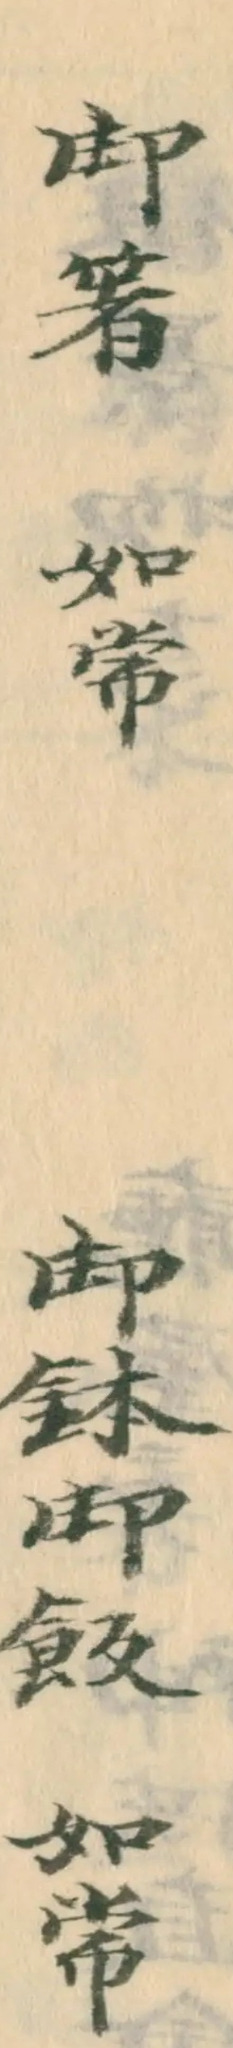御著如常御鉢御飯如常
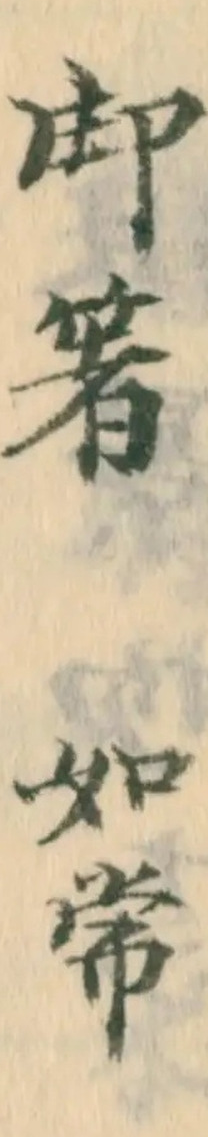御盃如常
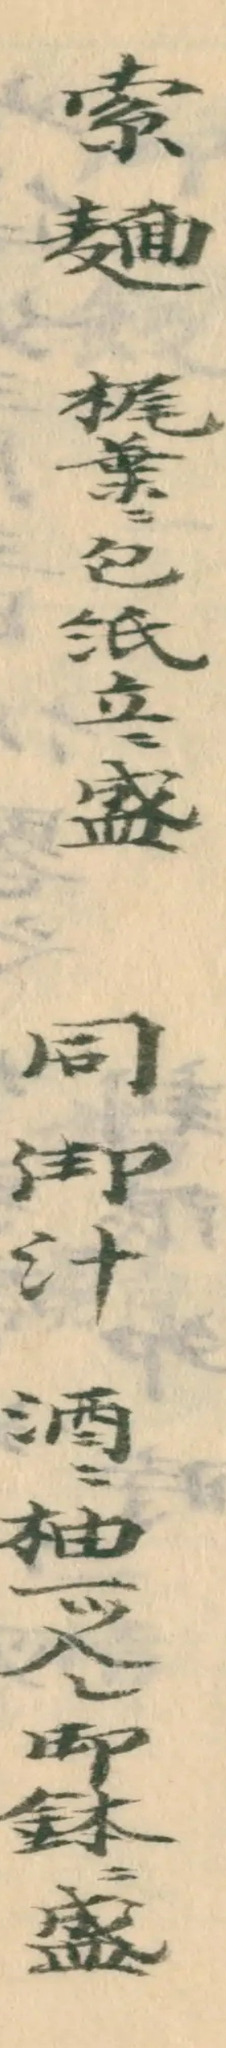索麺梶葉ニ包紙立ニ盛同御汁酒ニ柚一ツ入レ御鉢ニ盛
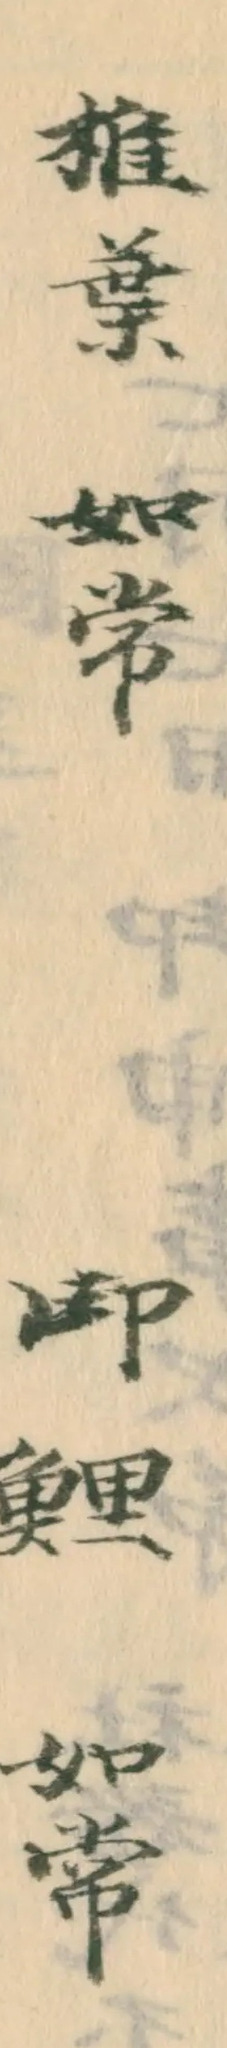椎葉如常御鯉如常
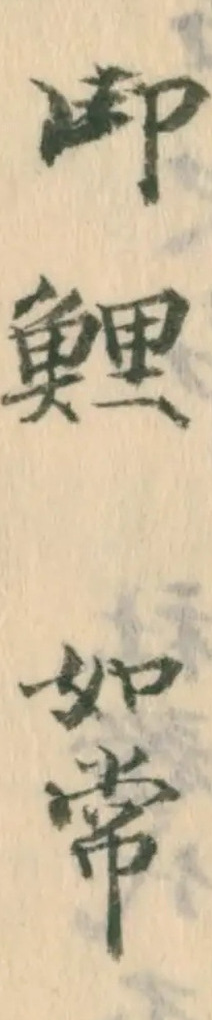御盃如常
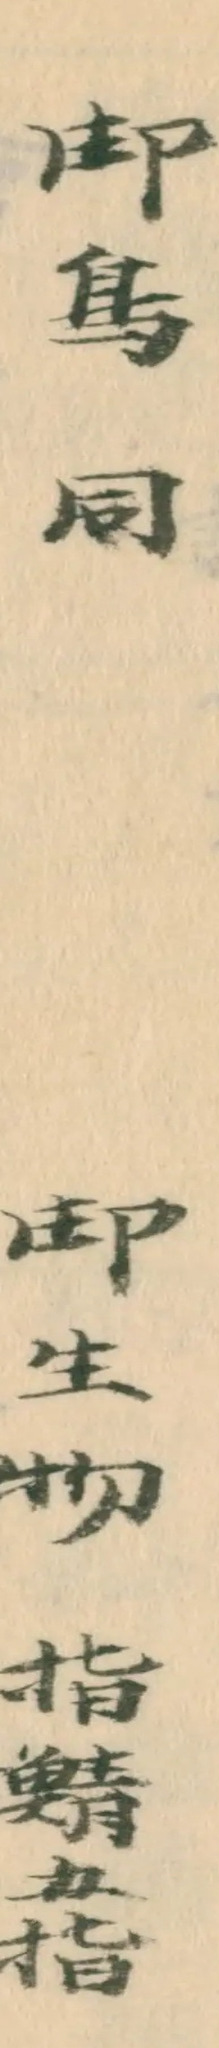御鳥同御生物指鯖五指
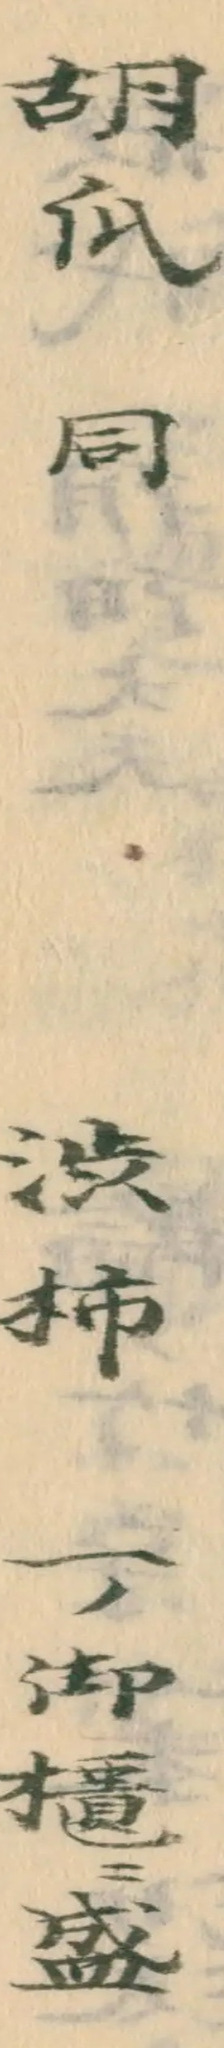胡瓜同渋柿一ノ御櫃ニ盛
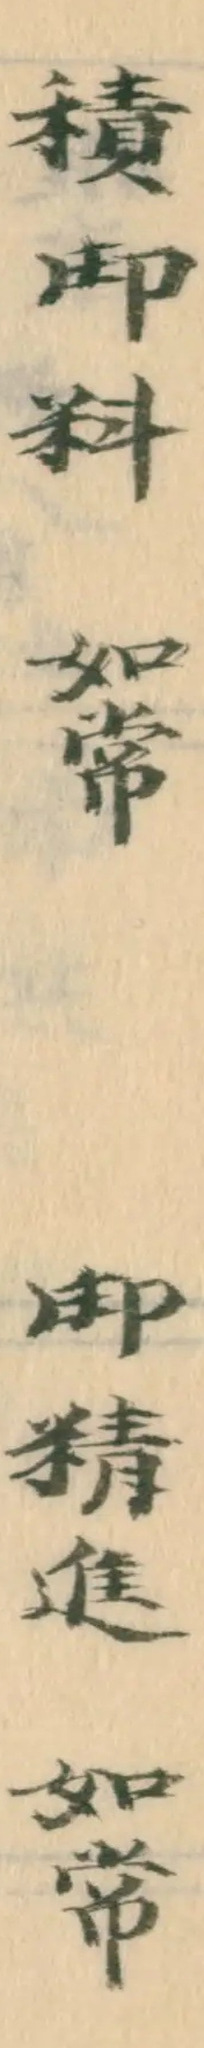積卸料如常御精進如常
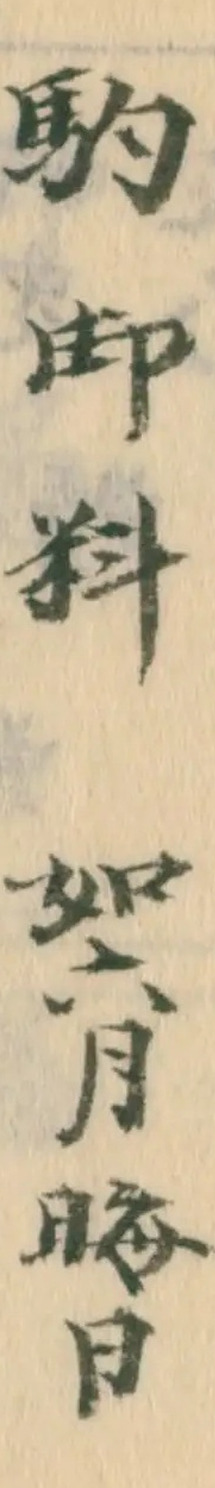駒御料如六月晦日
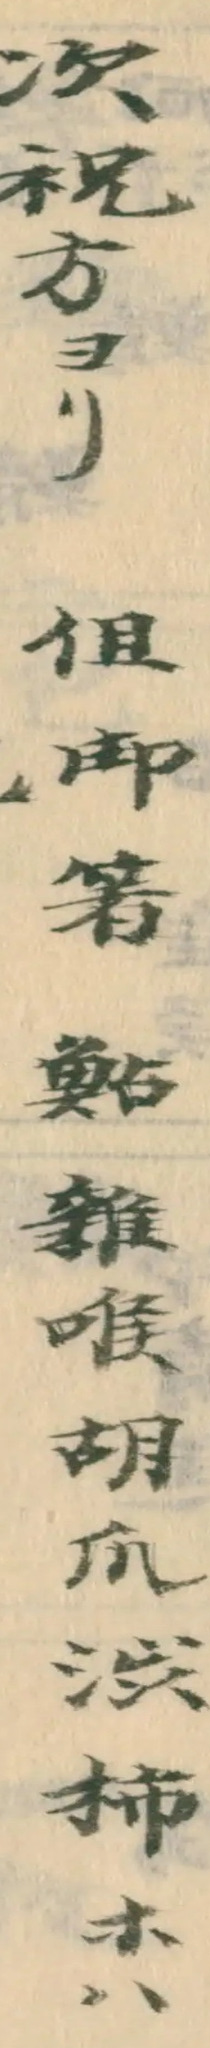次祝方ヨリ但御箸鮎雑喉胡瓜渋柿等ハ
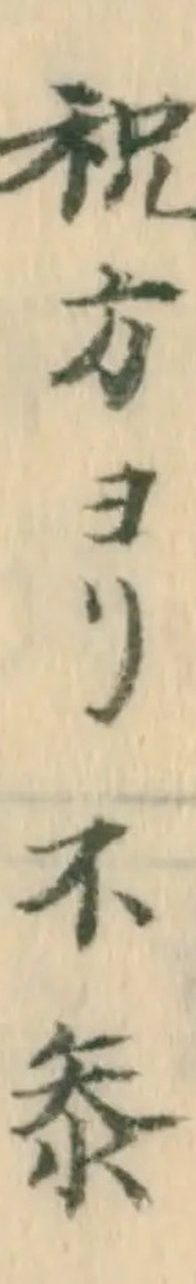祝方ヨリ不参
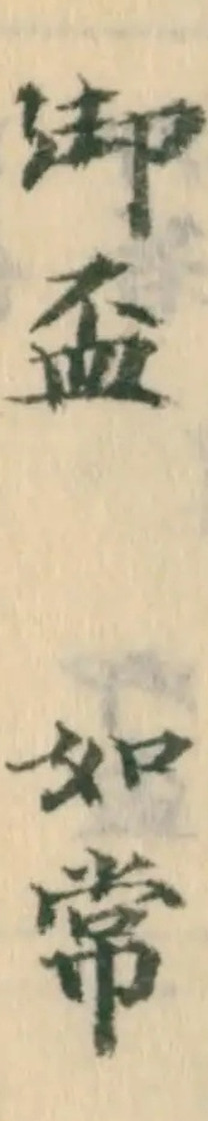御盃如常
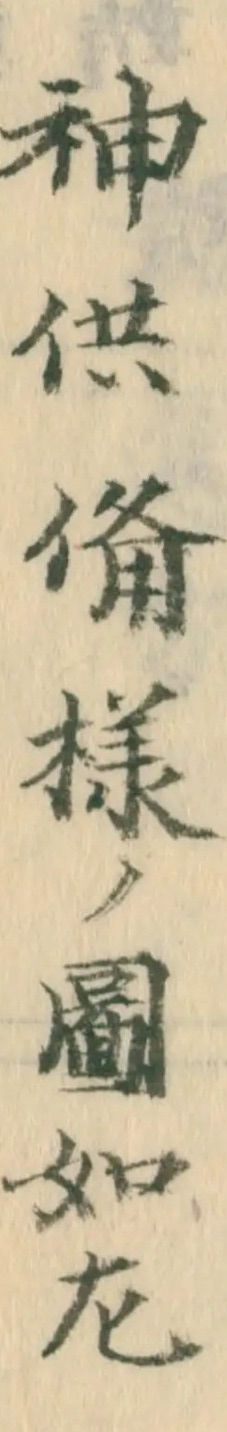神供備様ノ図如左

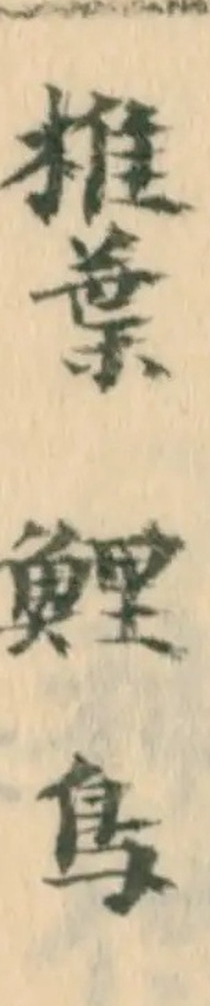椎葉鯉鳥
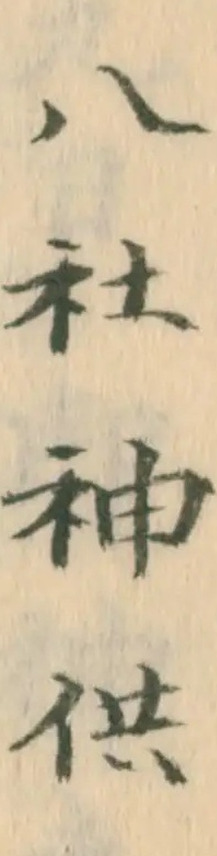八社神供
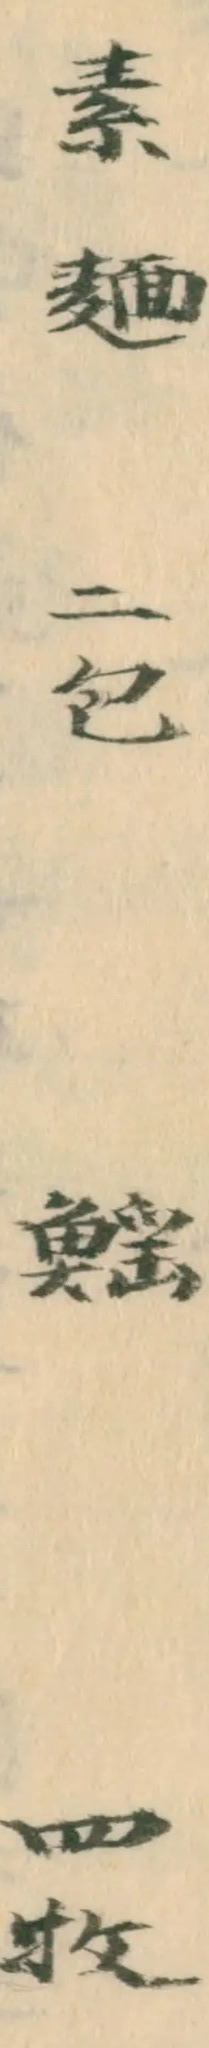素麺二包鰩四枚
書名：賀茂社記録. 第5冊
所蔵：国立国会図書館 National Diet Library, JAPAN
